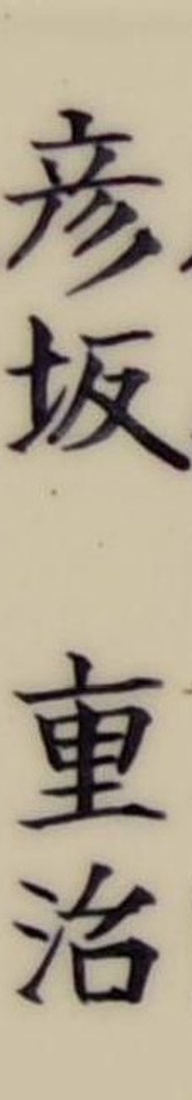彦坂重治
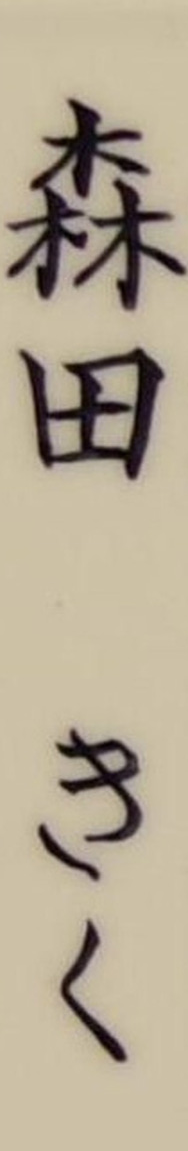森田きく
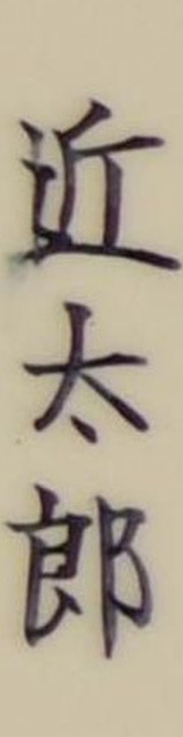近太郎

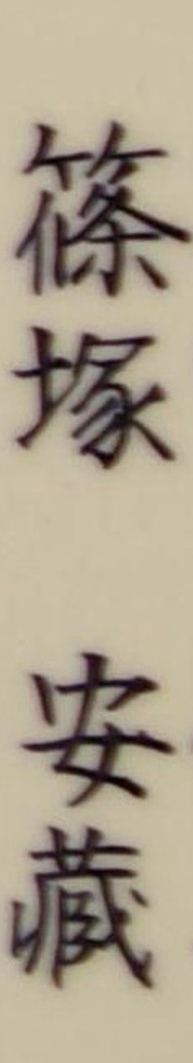篠塚安蔵
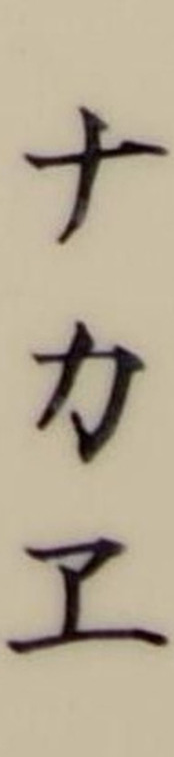ナカヱ
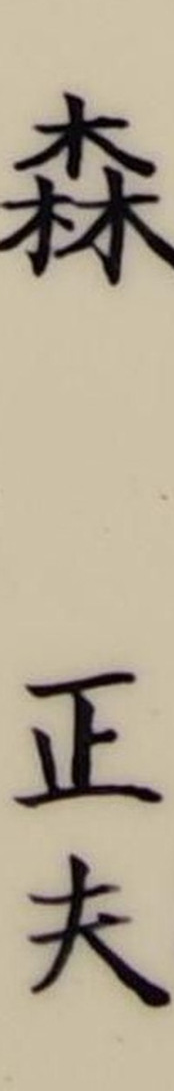森正夫
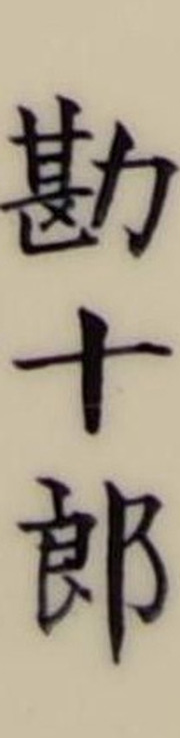勘十郎
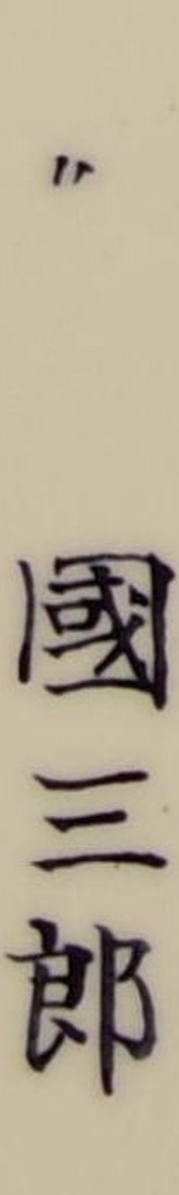國三郎
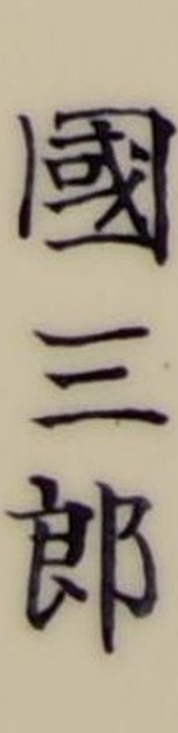國三郎
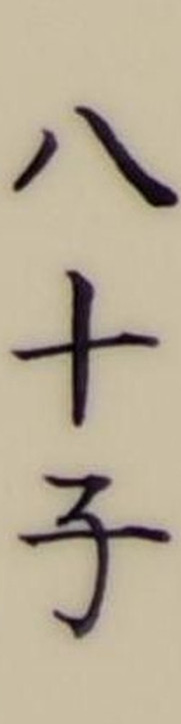八十子
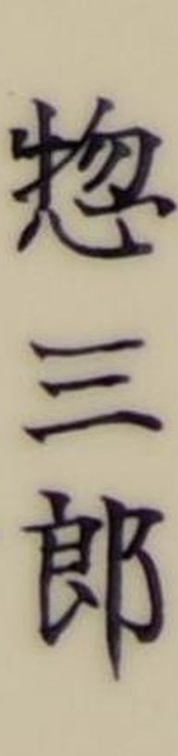惣三郎
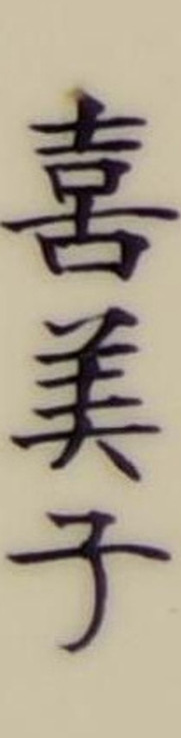喜美子

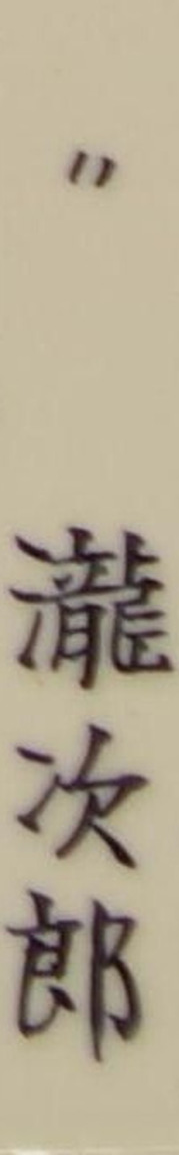瀧次郎
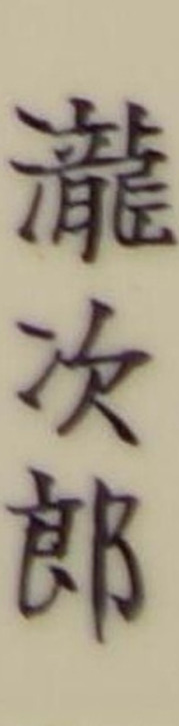瀧次郎
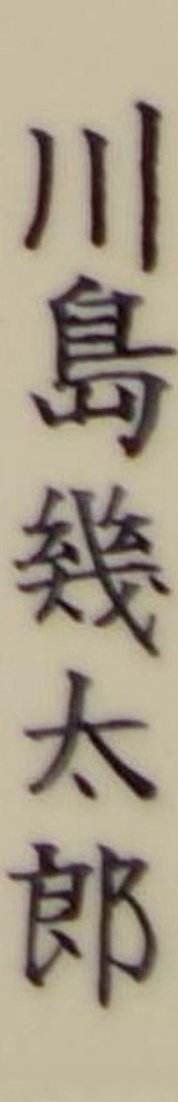川島幾太郎
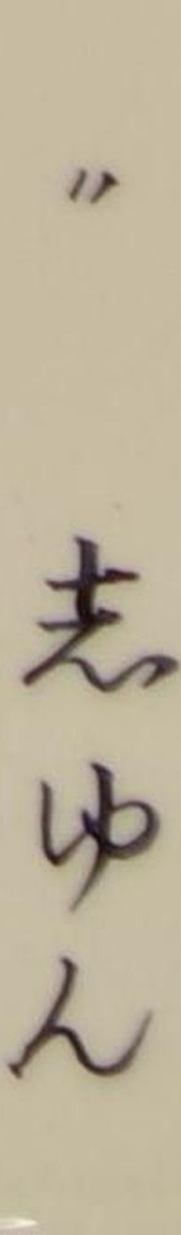しゆん
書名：A~D
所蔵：koyasan kongobuji
